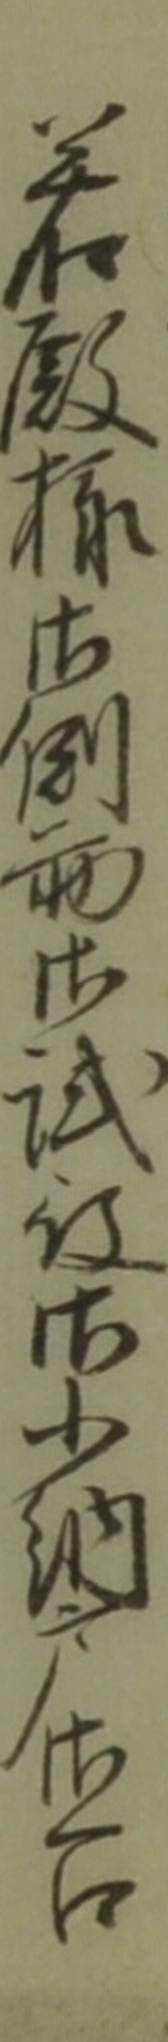若殿様御側勤御試役御小納戸御召
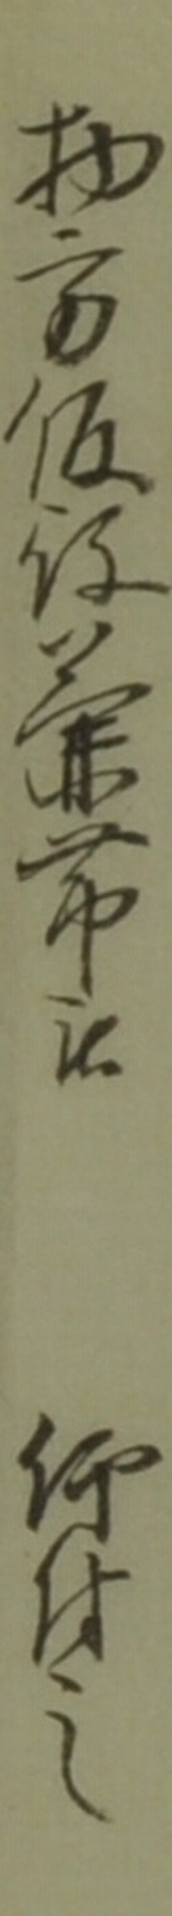物方仮役兼帯被仰付之

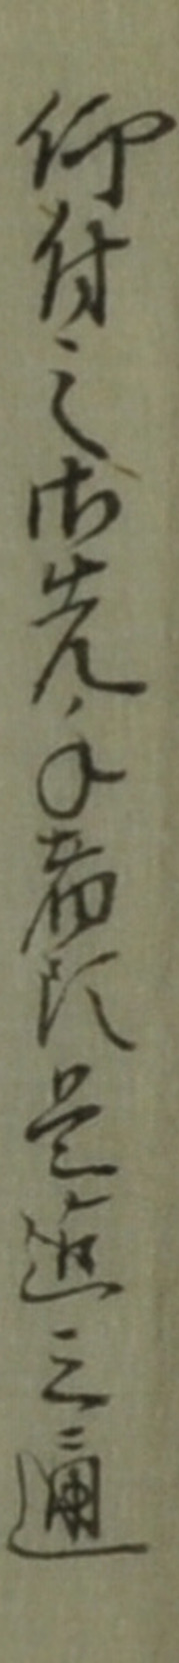仰付之御先手者頭是迄之通
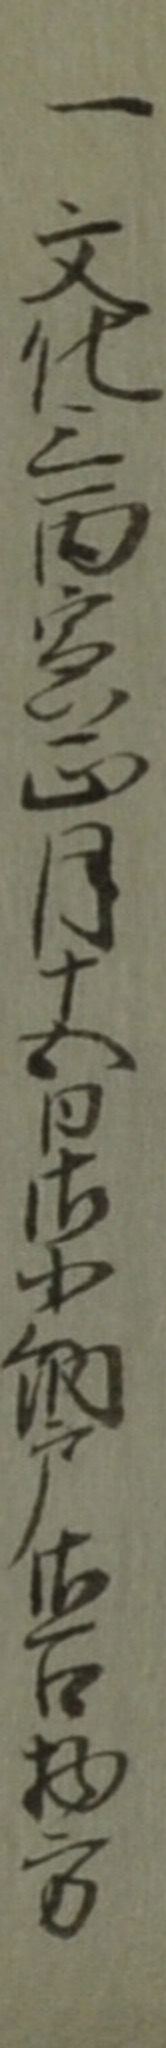一文化三丙寅正月十五日御小納戸御召物方
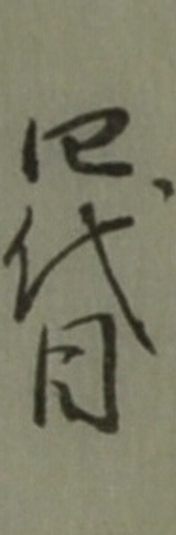四代目
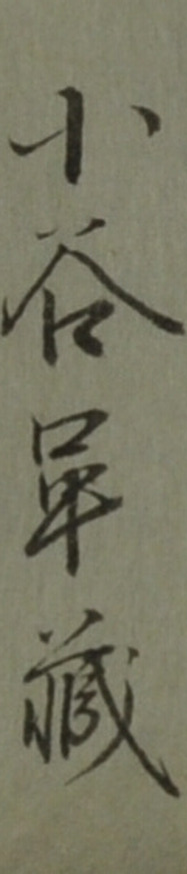小谷軍蔵
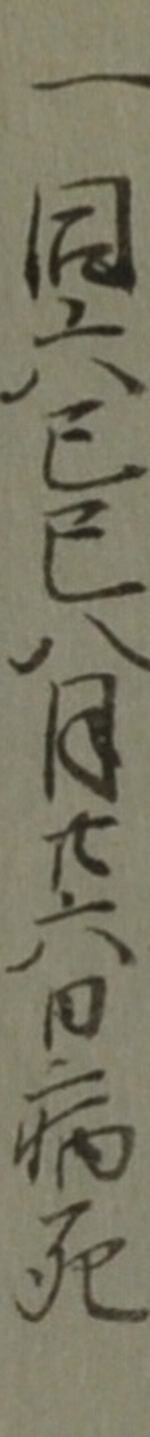一同六己巳八月廿六日病死
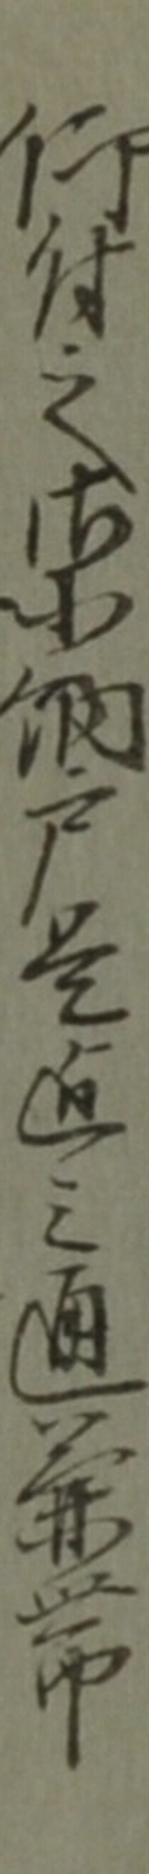仰付之御小納戸是迄之通兼帯
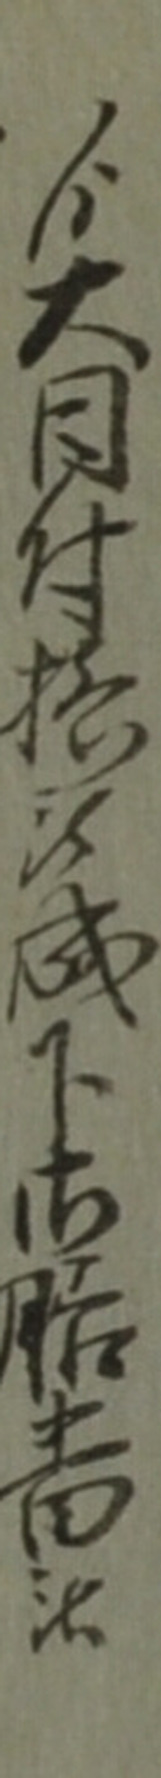ゟ大目付格被成下御膳番被
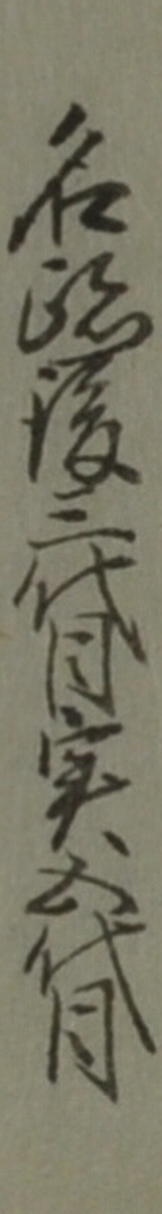名跡後三代目実五代目
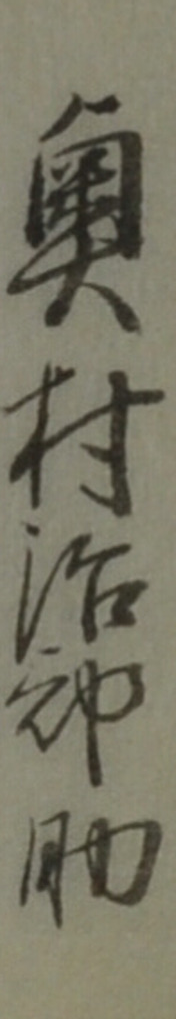奥村治部助
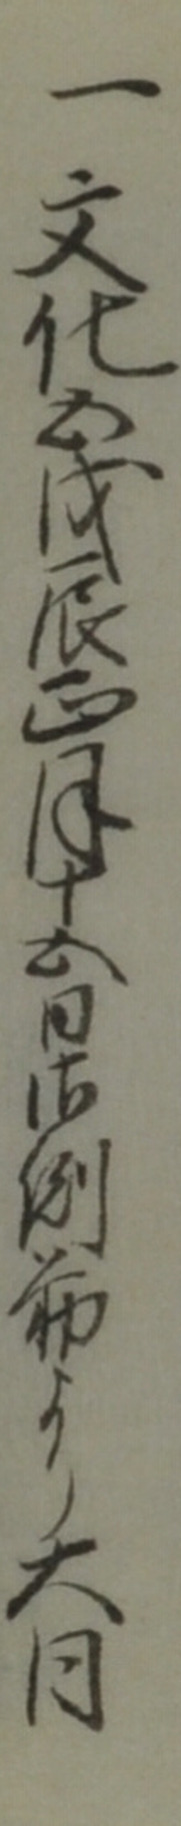一文化五戊辰正月十五日御側勤より大目
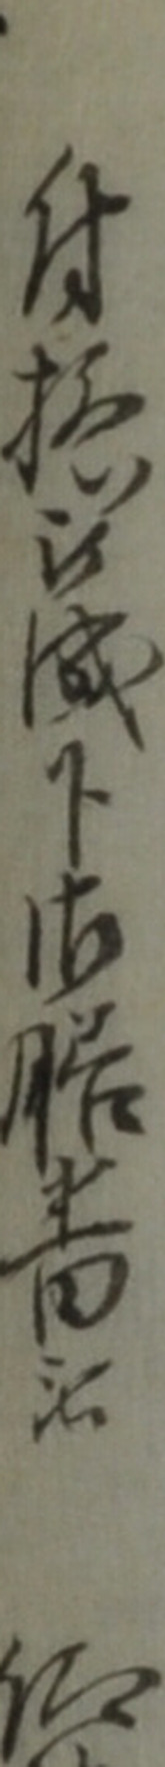付格被成下御膳番被仰付之
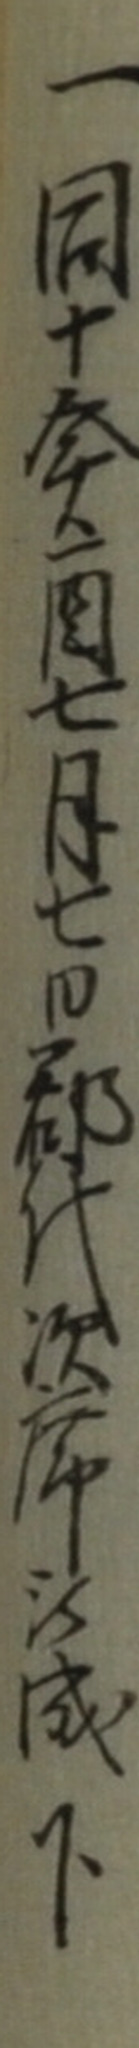一同十癸酉七月七日郡代次席被成下
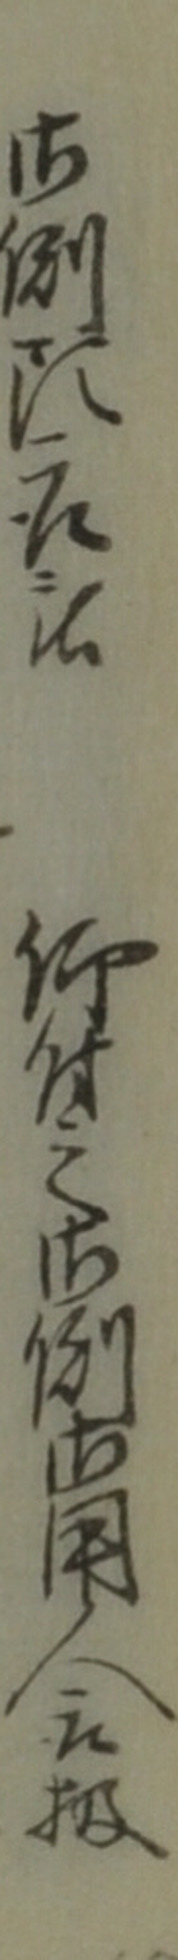御側頭取被仰付之御側御用人取扱
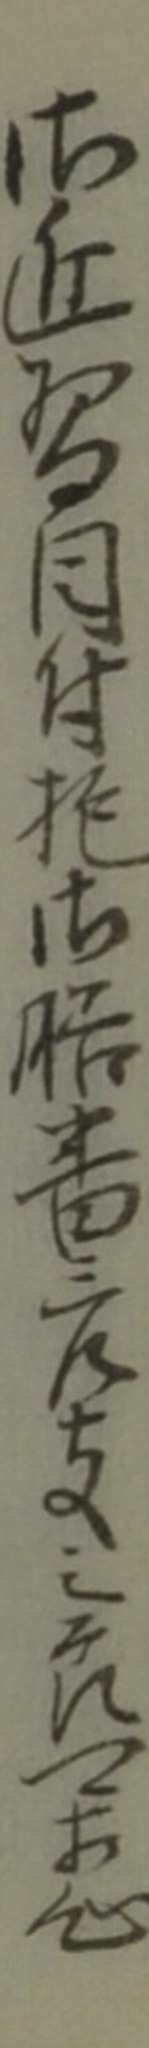御近習目付抱御膳番差支之節可相心
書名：諸御役代々録（四）
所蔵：伊那市立高遠町図書館・合同会社AMANE
